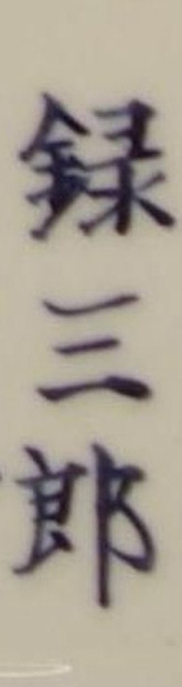録三郎
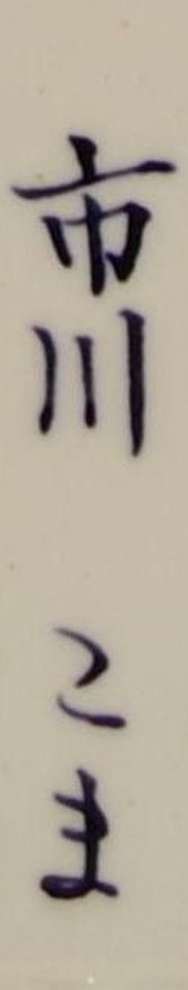市川こま
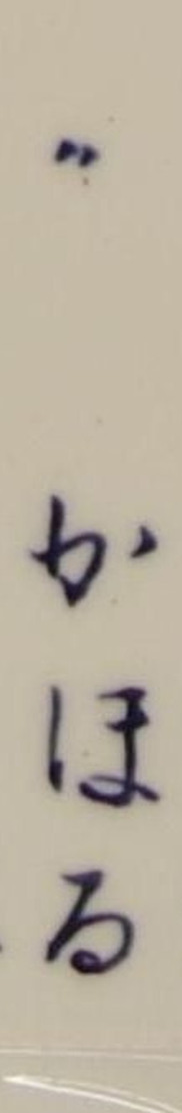かほる
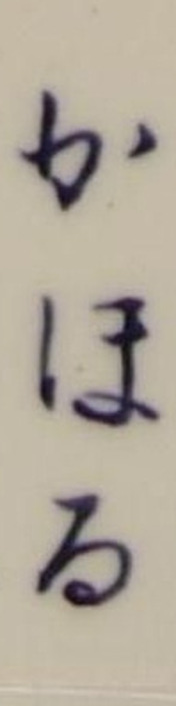かほる
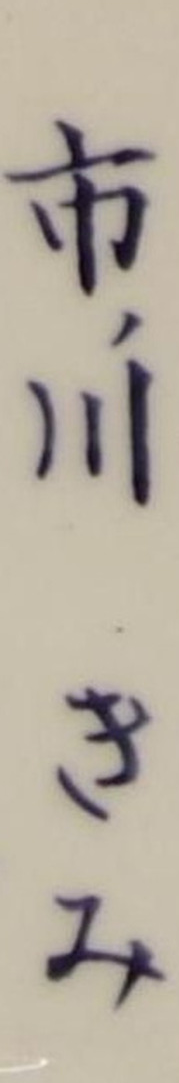市ノ川きみ
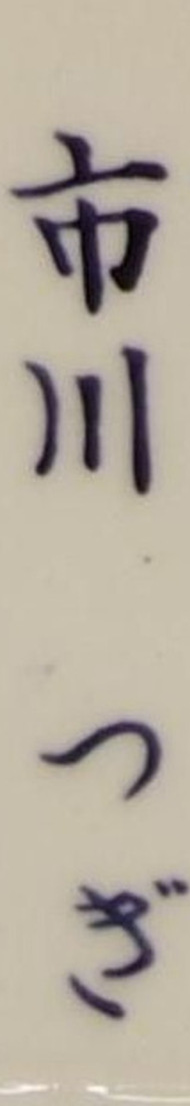市川つぎ
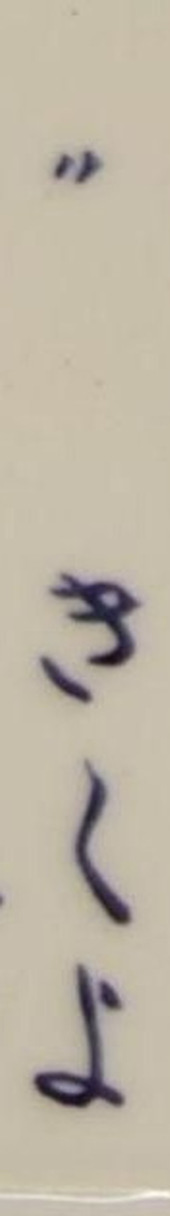きくよ
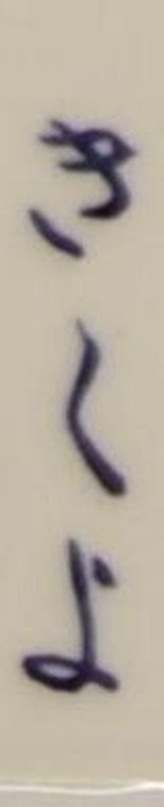きくよ

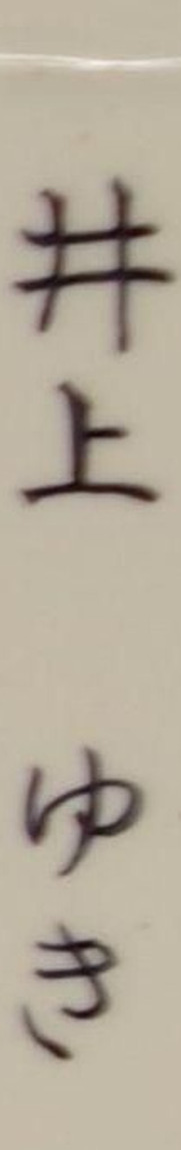井上ゆき
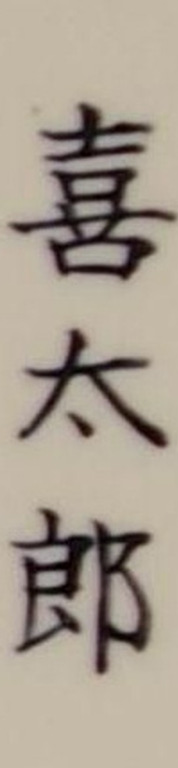喜太郎
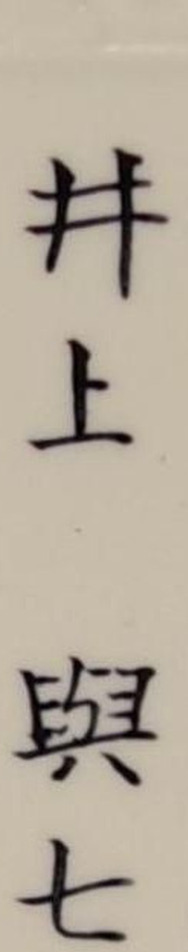井上與七
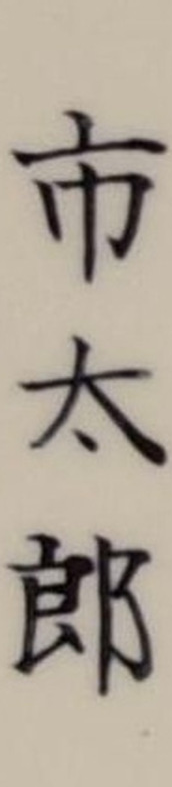市太郎
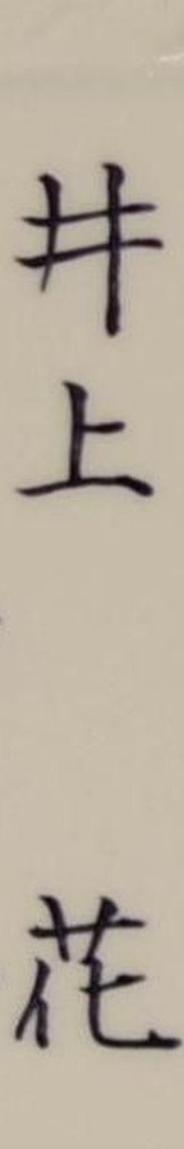井上花
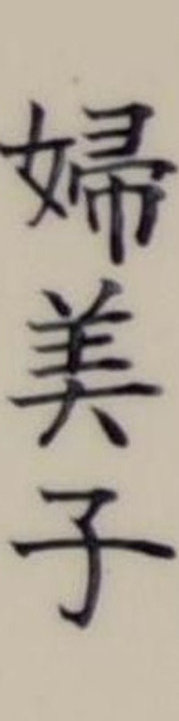婦美子
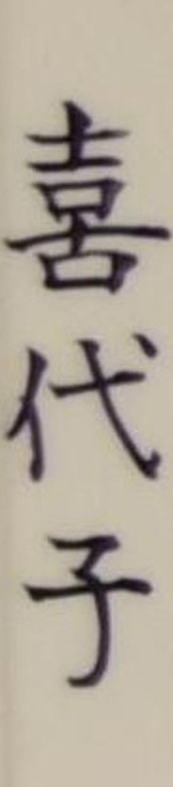喜代子

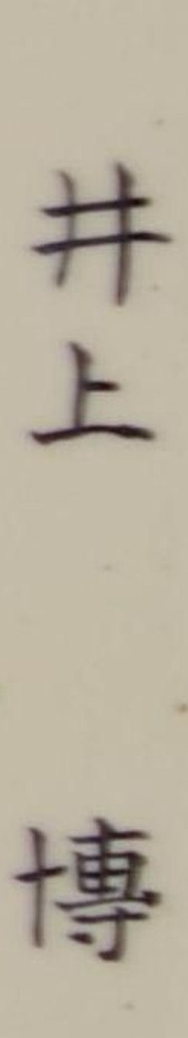井上博
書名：M~S
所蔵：高野山金剛峯寺
